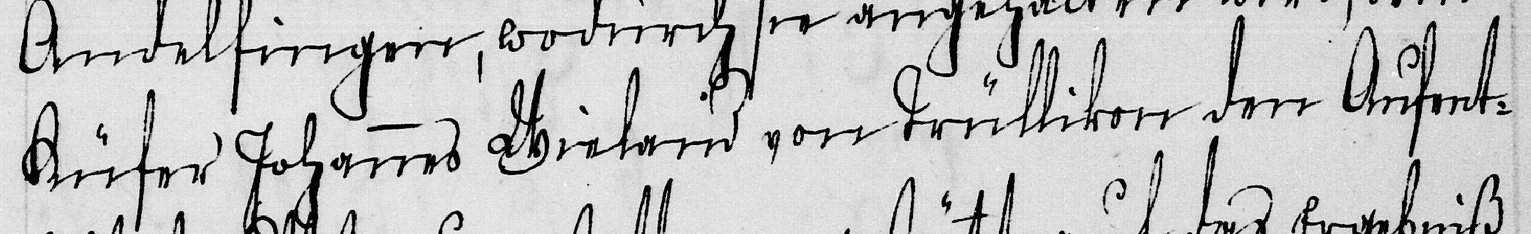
Küfer Johannes Wieland von Trüllikon den Aufent¬
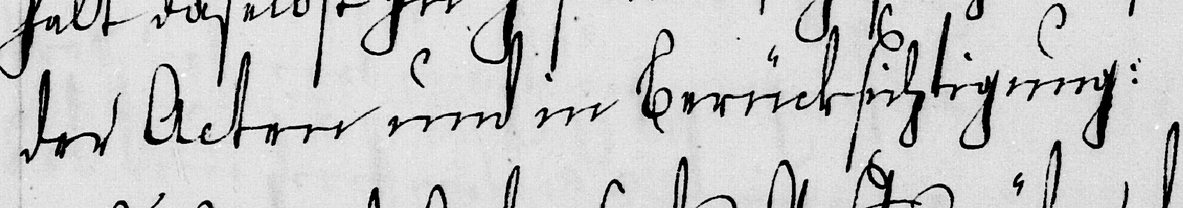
der Acten und in Berücksichtigung:
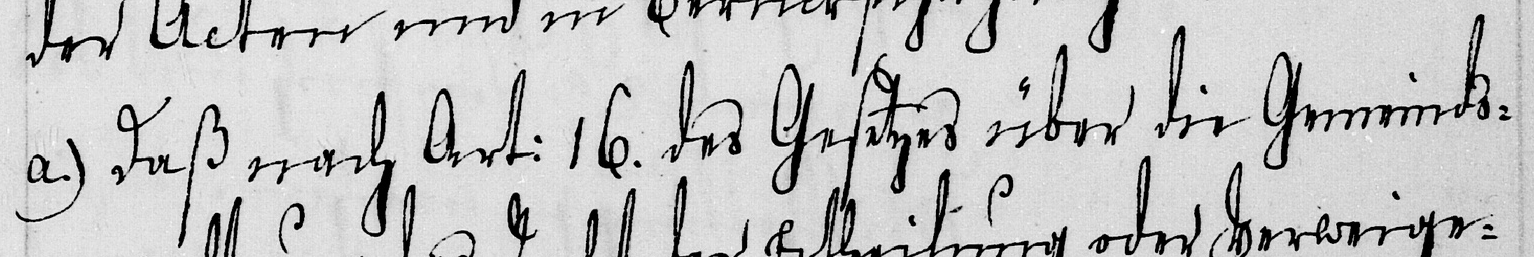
a.) Daß nach Art: 16. des Gesetzes über die Gemeinds¬
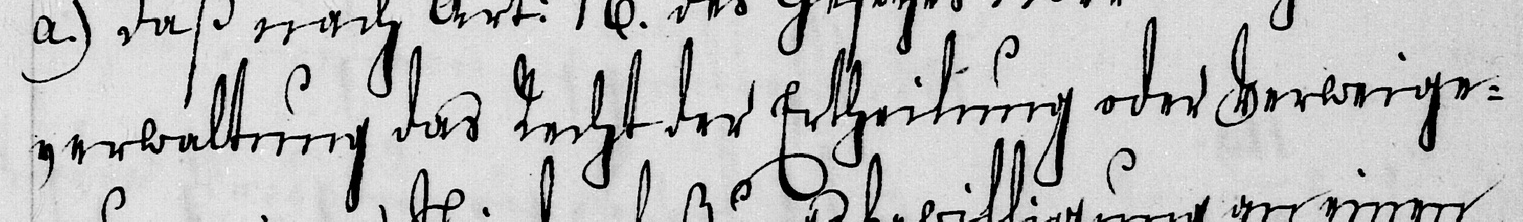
verwaltung das Recht der Ertheilung oder Verweige¬
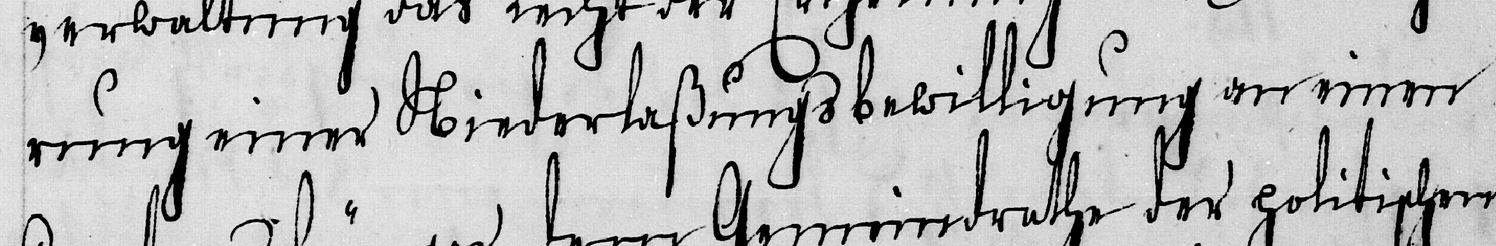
rung einer Niederlaßungsbewilligung an einen
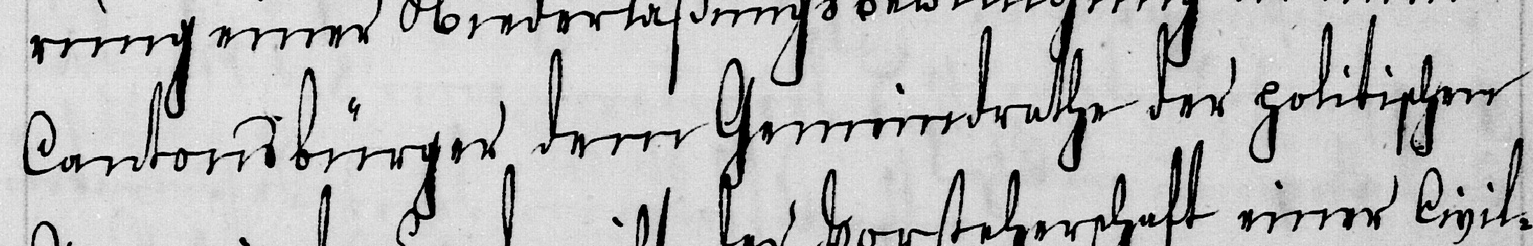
Cantonsbürger dem Gemeindrathe der politischen
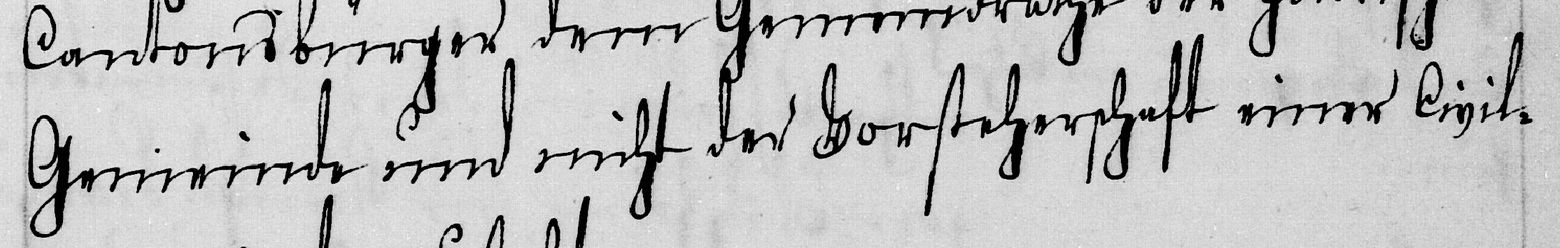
Gemeinde und nicht der Vorsteherschaft einer Civil¬
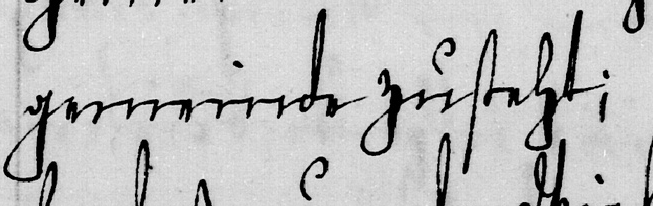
gemeinde zusteht;
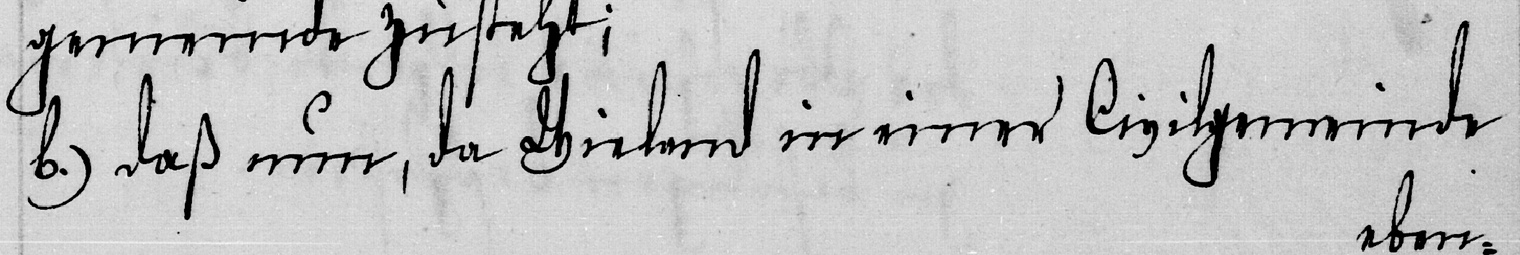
b.) daß nun, da Wieland in einer Civilgemeinde
